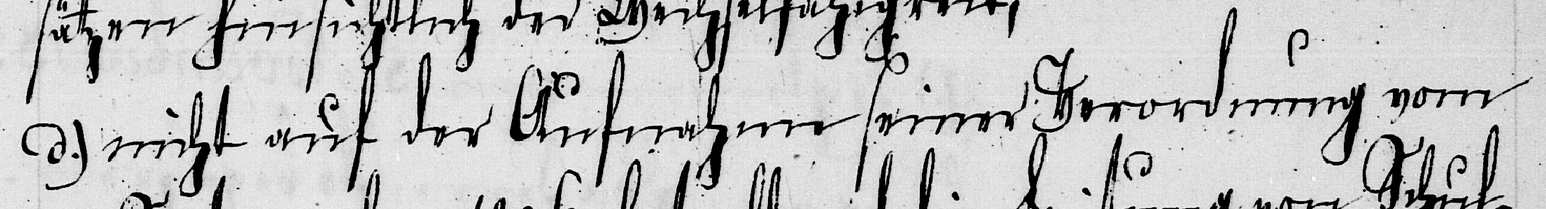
d.) nicht auf der Aufnahme seiner Verordnung vom
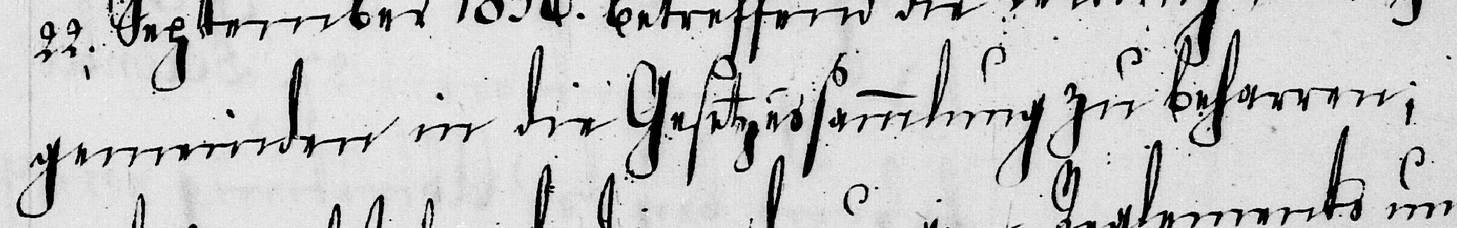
gemeinden in die Gesetzessammlung zu beharren;
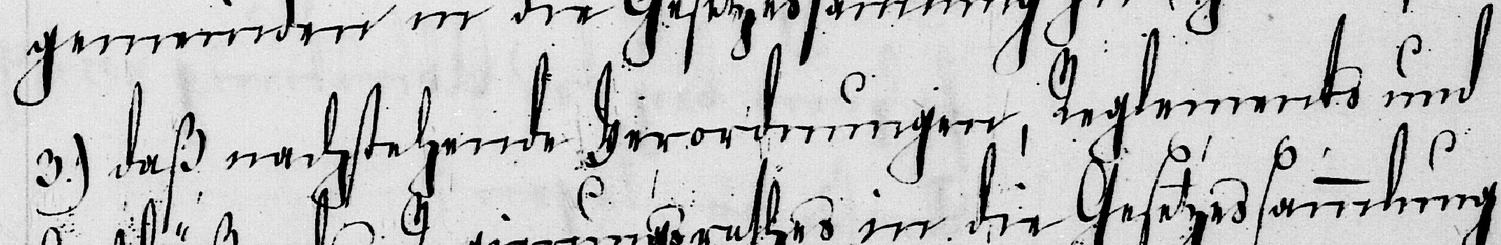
3.) daß nachstehende Verordnungen, Reglements und
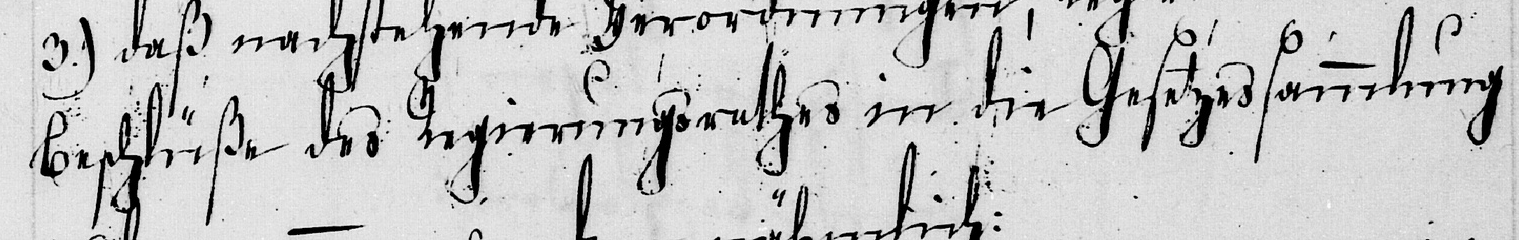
Beschlüße des Regierungsrathes in die Gesetzessammlung
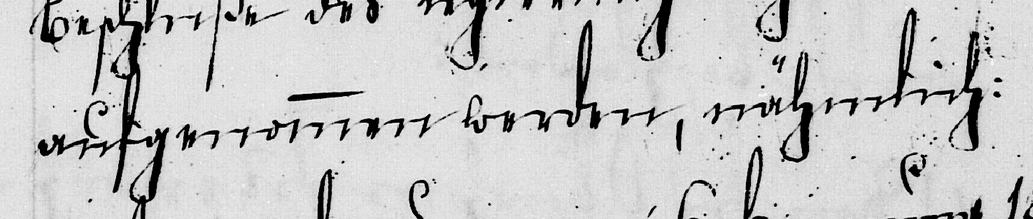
aufgenommen werden, nähmlich:
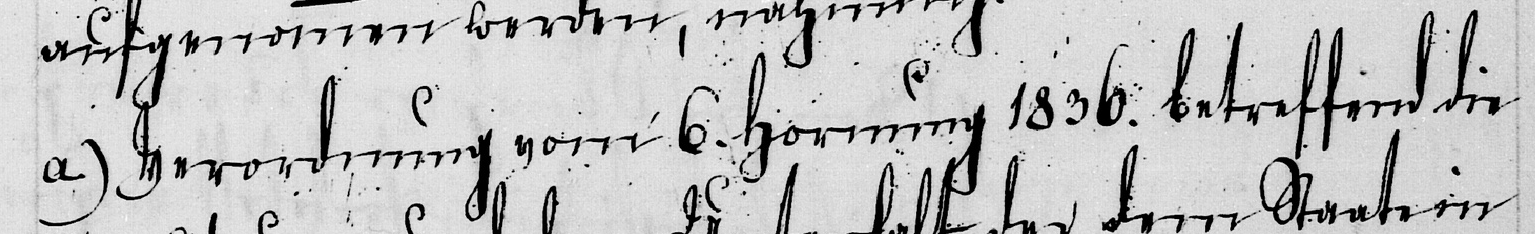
a.) Verordnung vom 6. Hornung 1836. betreffend die
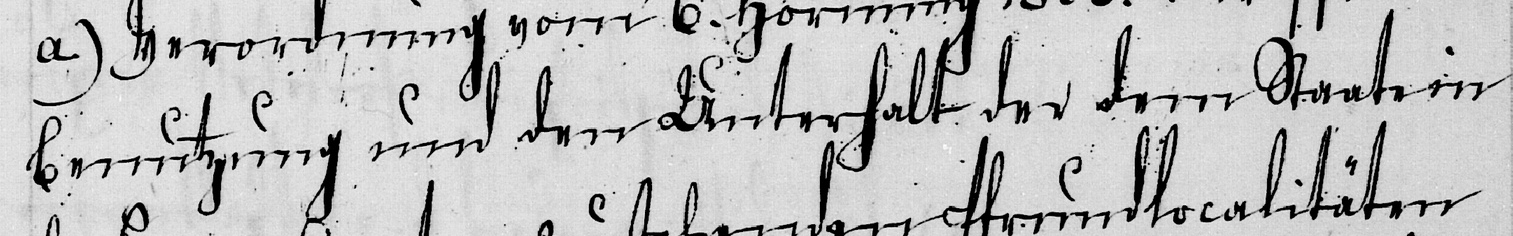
Benutzung und den Unterhalt der dem Staate in
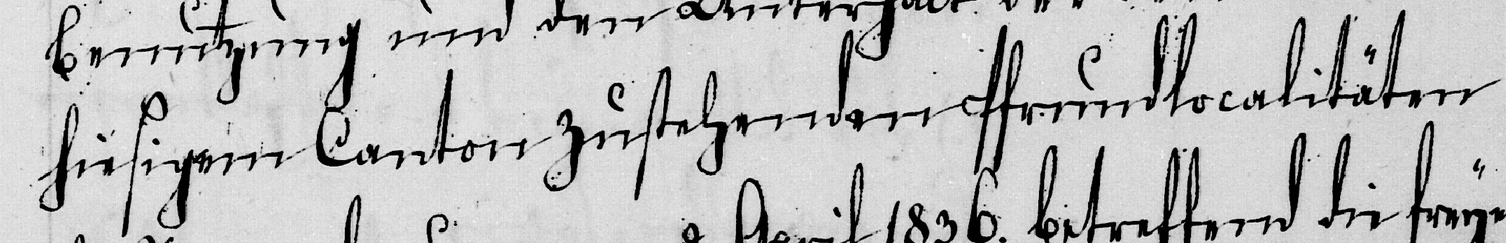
hiesigem Canton zustehenden Pfrundlocalitäten
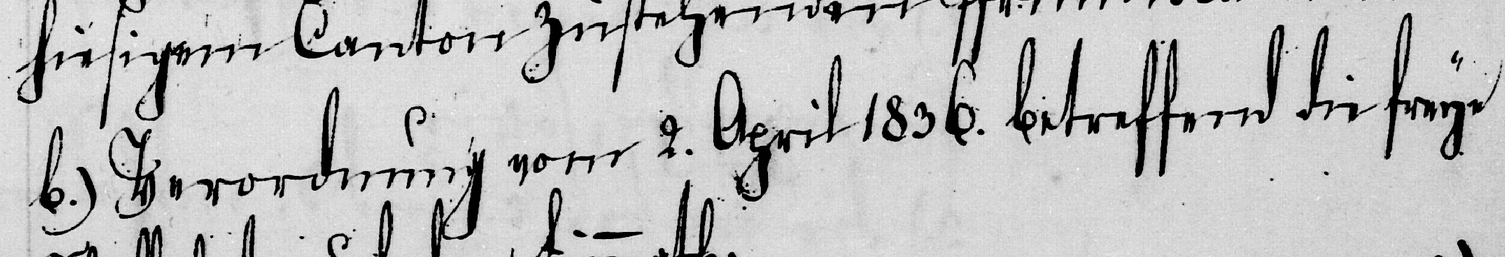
b.) Verordnung vom 2. April 1836. betreffend die fre¬
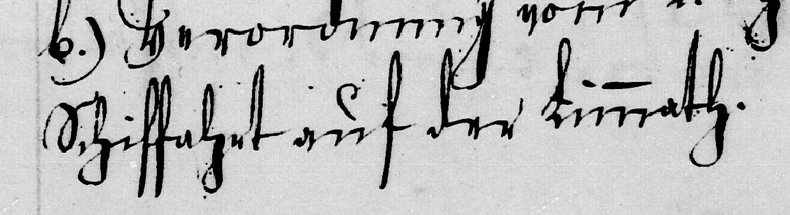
Schiffahrt auf der Limmath.
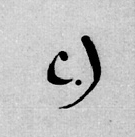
c.)
